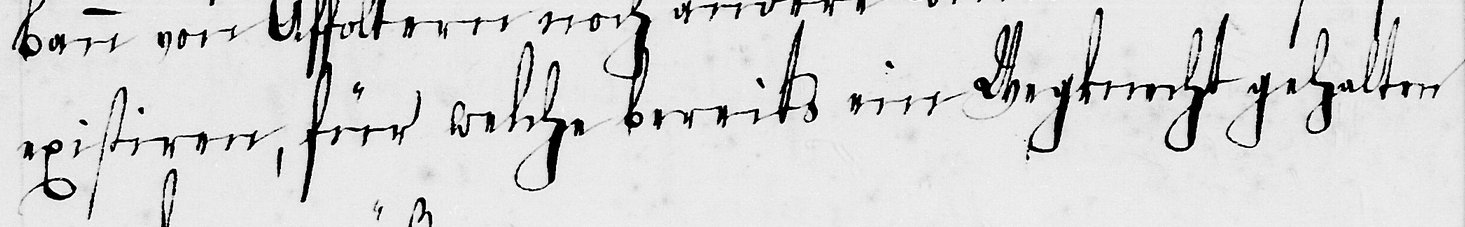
existiren, für welche bereits ein Wegknecht gehalten
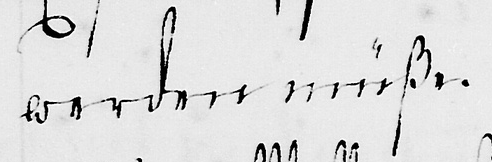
werden müße.
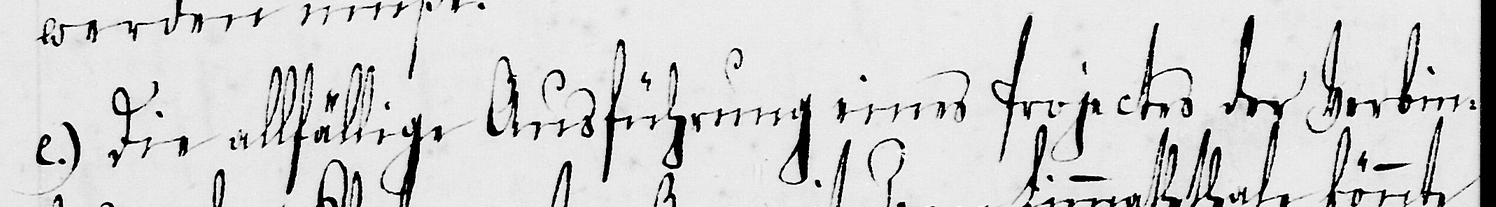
e.) Die allfällige Ausführung eines Projectes der Verbin¬
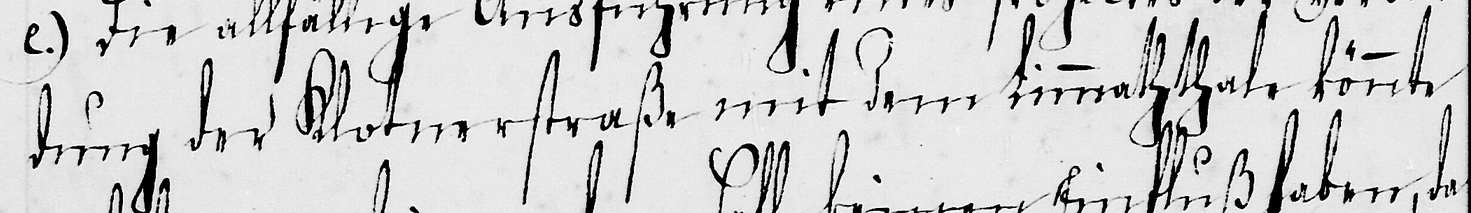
dung der Klotnerstraße mit dem Limmaththale könnte
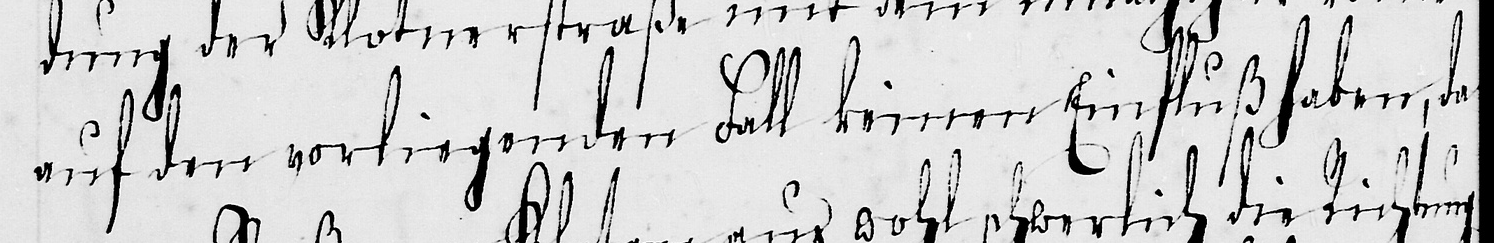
auf den vorliegenden Fall keinen Einfluß haben, da
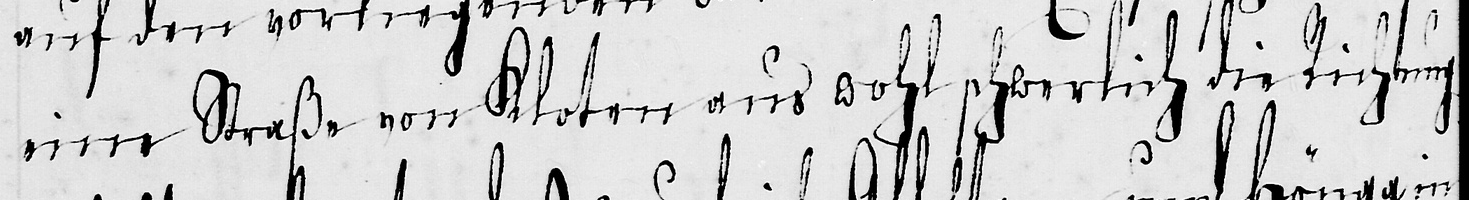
eine Straße von Kloten aus wohl schwerlich die Richtung
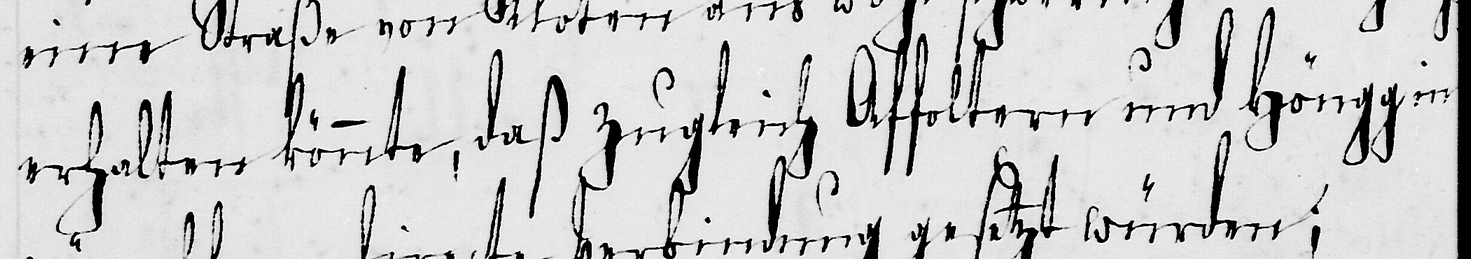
erhalten könnte, daß zugleich Affoltern und Höngg in
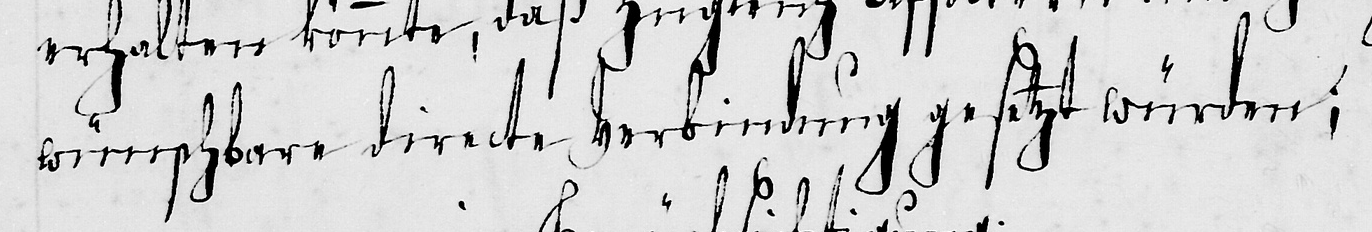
wünschbare directe Verbindung gesetzt würden;
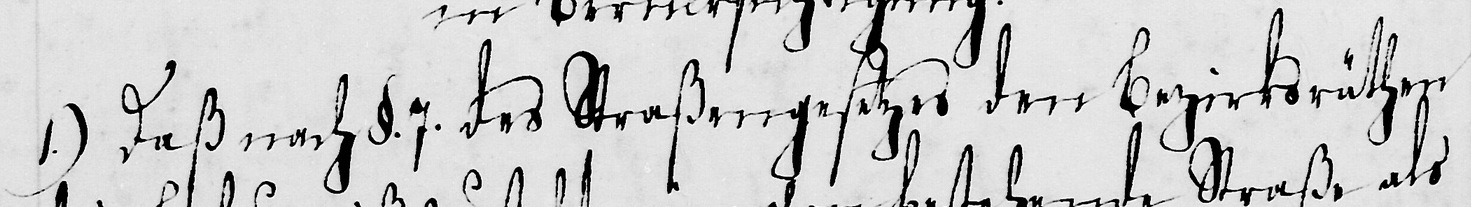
1.) Daß nach §. 7. des Straßengesetzes den Bezirksräthen
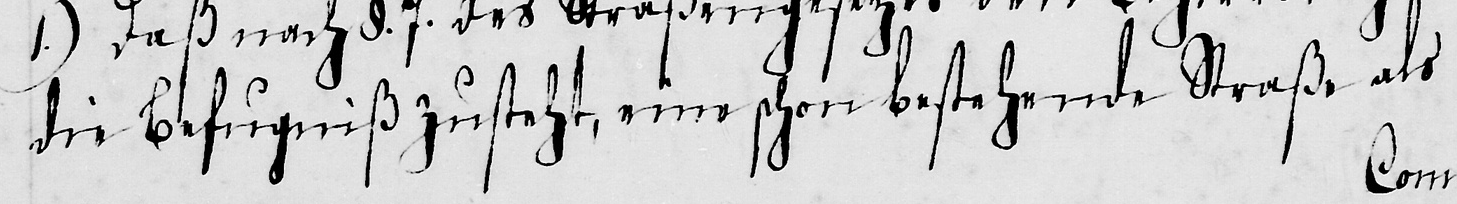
die Befugniß zusteht, eine schon bestehende Straße als
